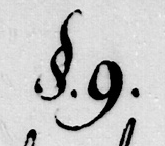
§. 9.
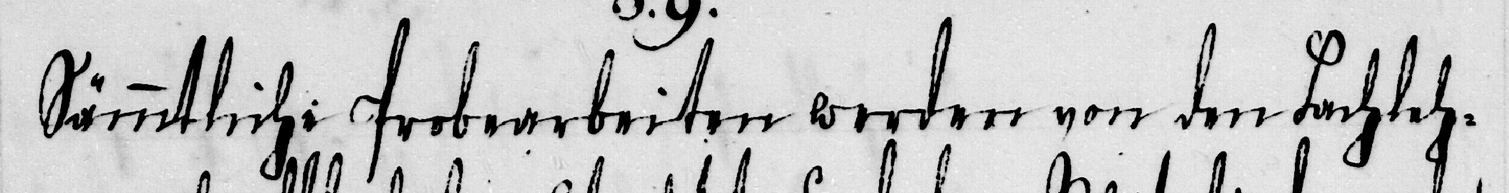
Sämmtliche Probearbeiten werden von den Sachleh¬
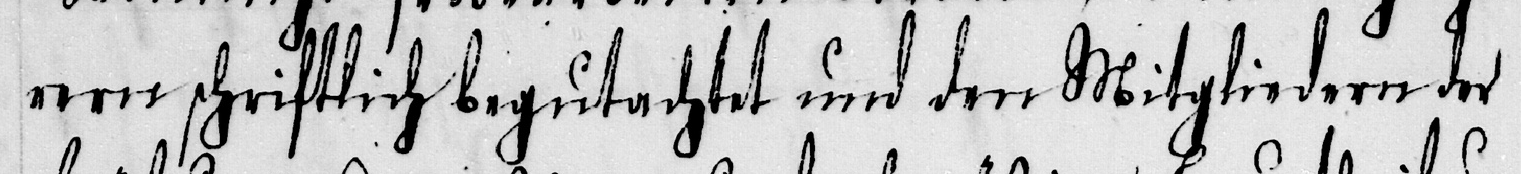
rern schriftlich begutachtet und den Mitgliedern der
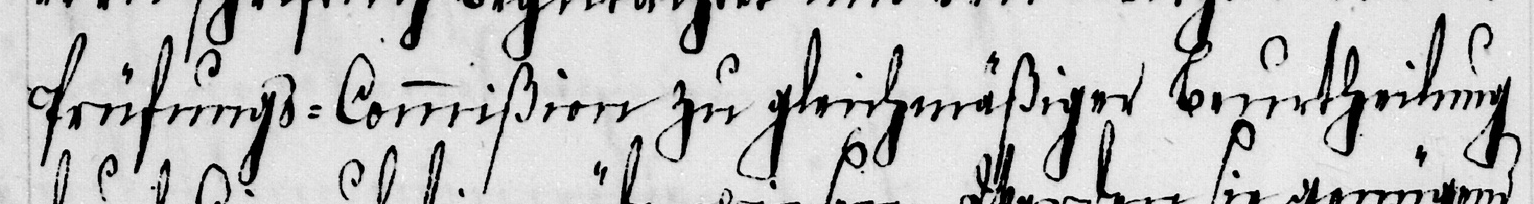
Prüfungs-Commißion zu gleichmäßiger Beurtheilung
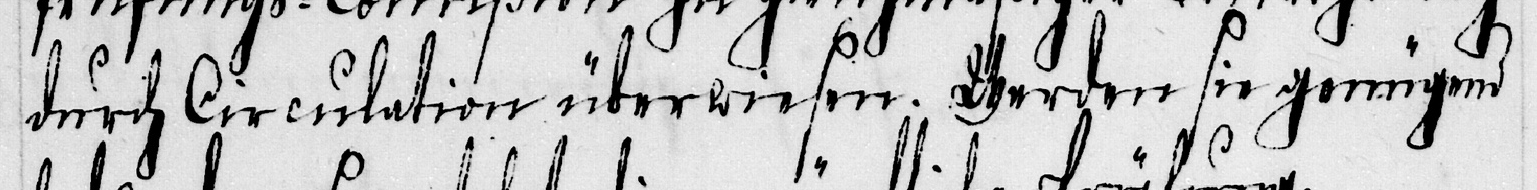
durch Circulation überwiesen. Werden sie genügend
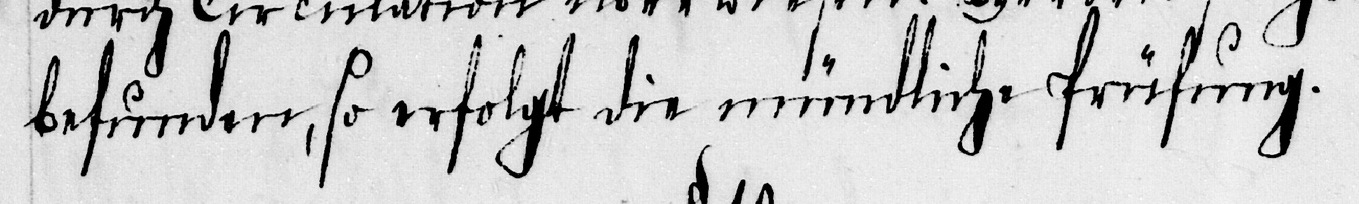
befunden, so erfolgt die mündliche Prüfung.
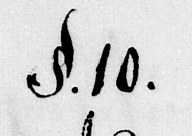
§. 10.
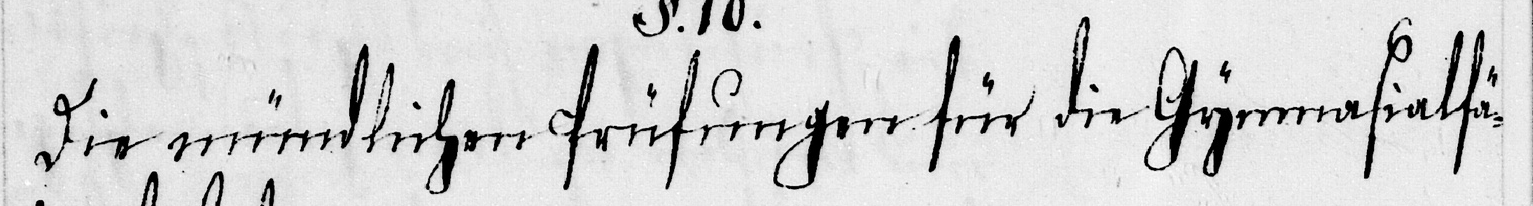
Die mündlichen Prüfungen für die Gymnasialfä¬
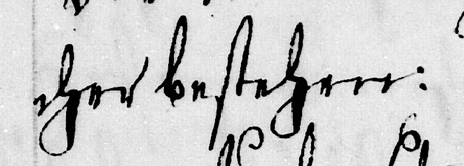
cher bestehen:
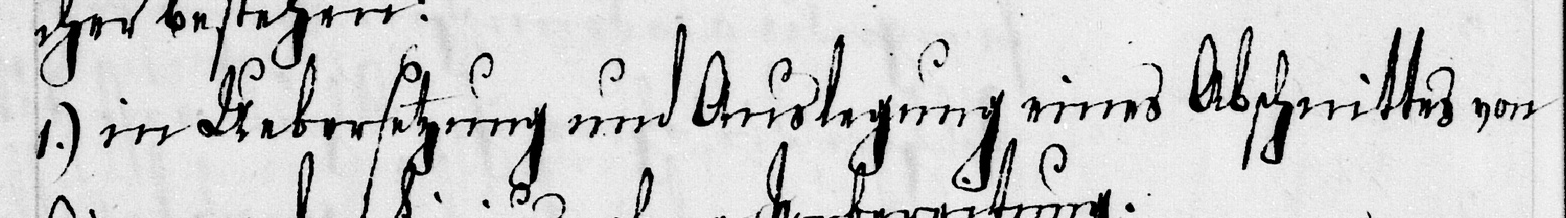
1.) in Uebersetzung und Auslegung eines Abschnittes von
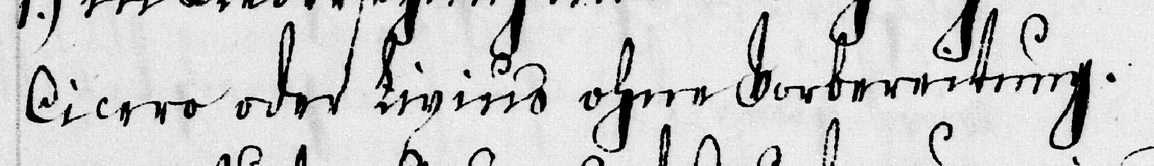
Cicero oder Livius ohne Vorbereitung.
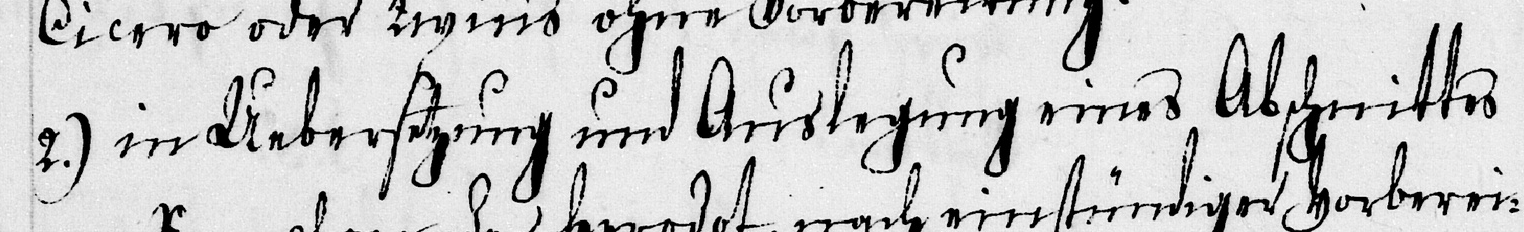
2.) in Uebersetzung und Auslegung eines Abschnittes
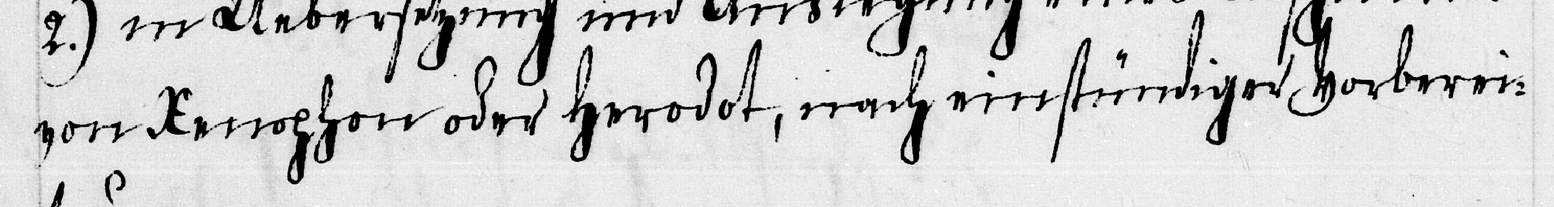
von Xenophon oder Herodot, nach einstündiger Vorberei¬
